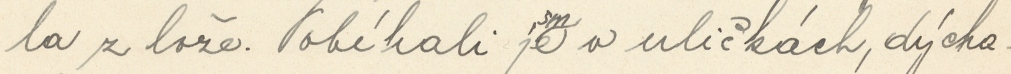la z lože. Pobíhali jsme v uličkách, dýcha-
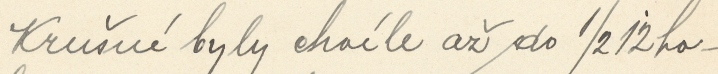Krušné byly chvíle až do 1/2 12 ho-
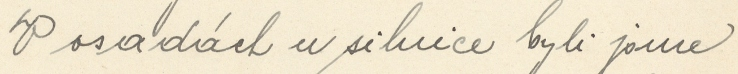V osadách u silnice byli jsme
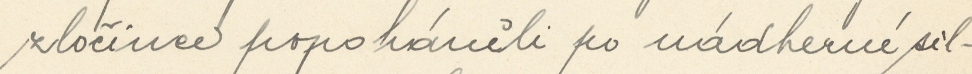zločince popoháněli po nádherné sil-
